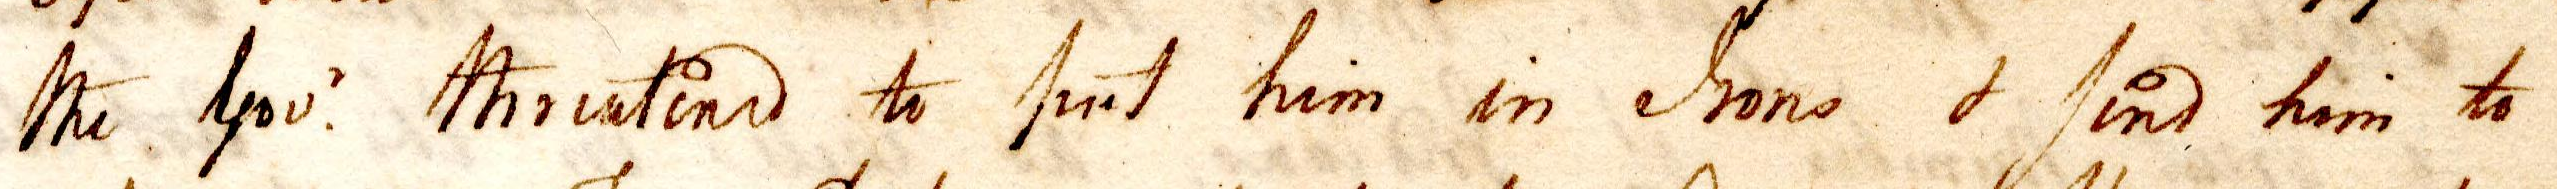the Gov^r. threatened to put him in Irons & send him to
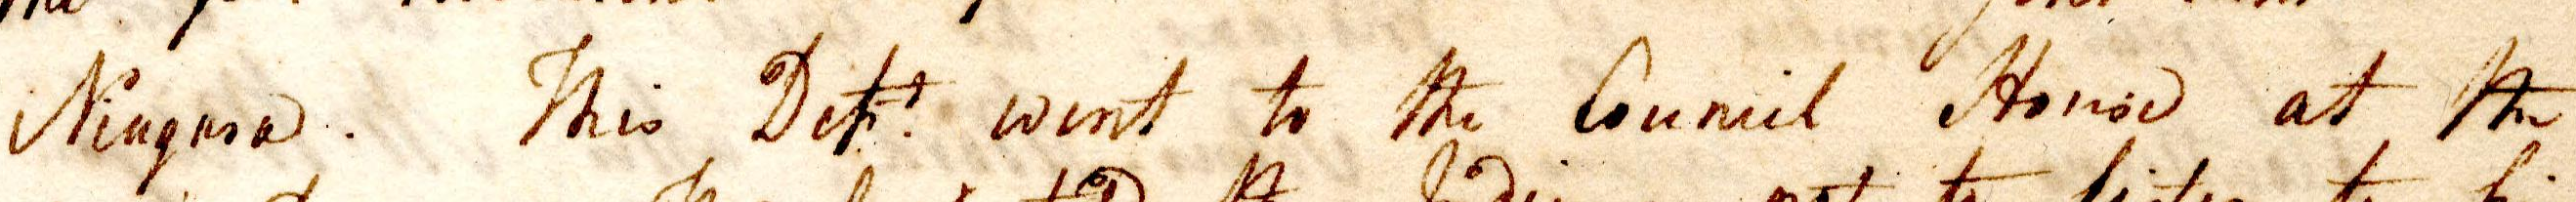Niagara. This Dep^t. went to the Council House at the
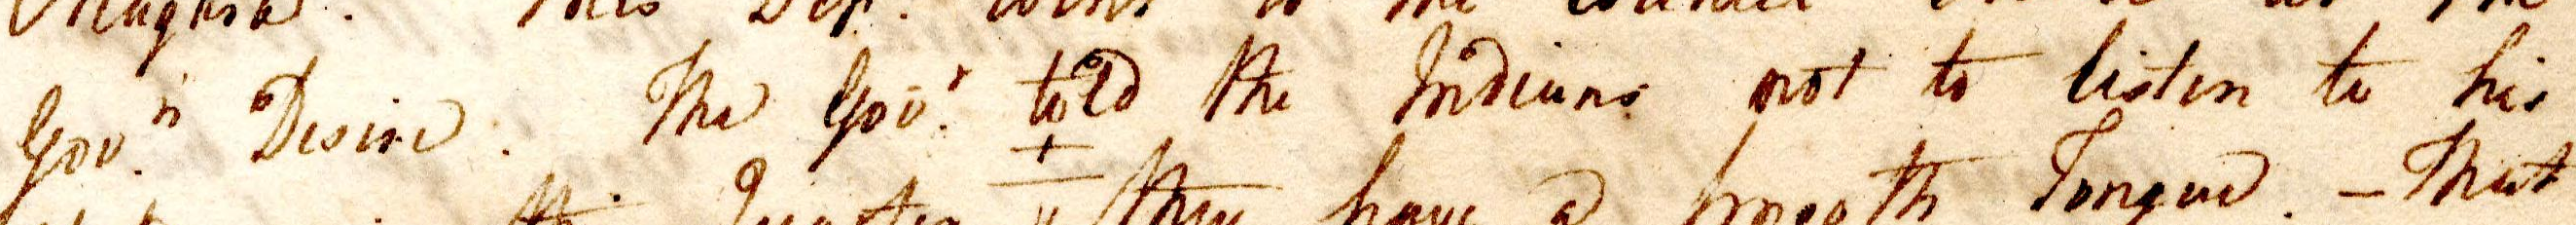Gov^r Desire. The Gov^r. told the Indians not to listen to his
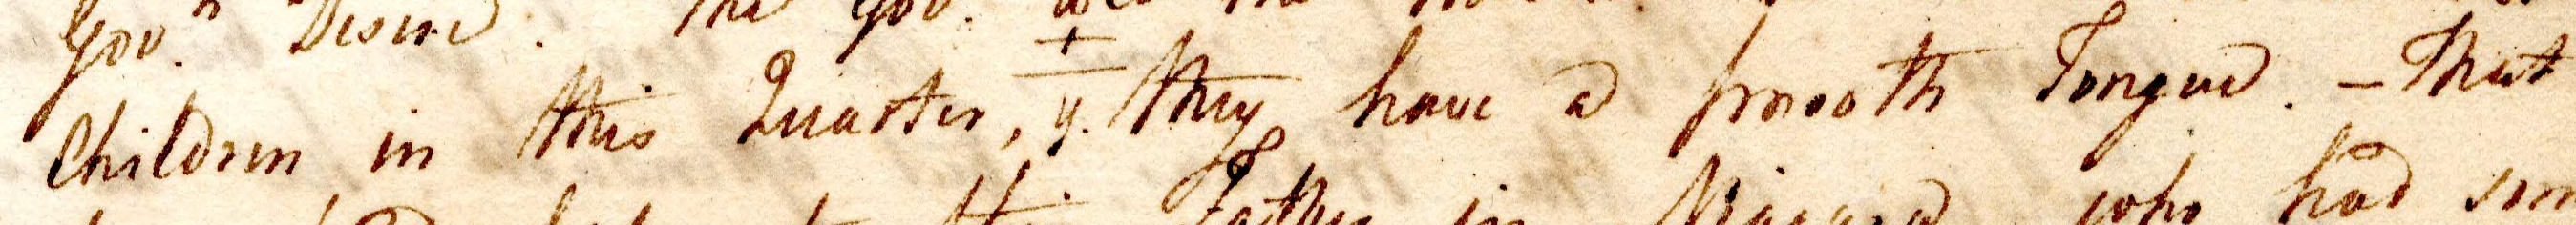Children in this Quarter, & they have a smooth Tongue.- That
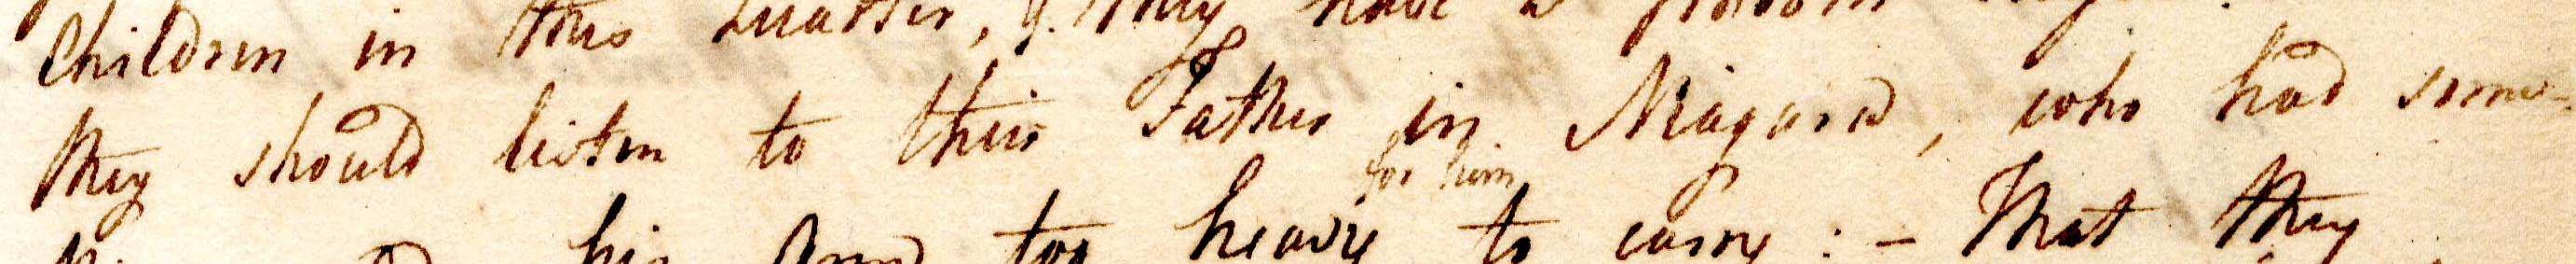they should listen to their Father in Niagara, who had some
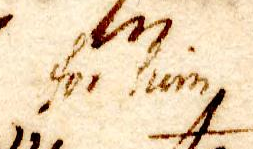for him
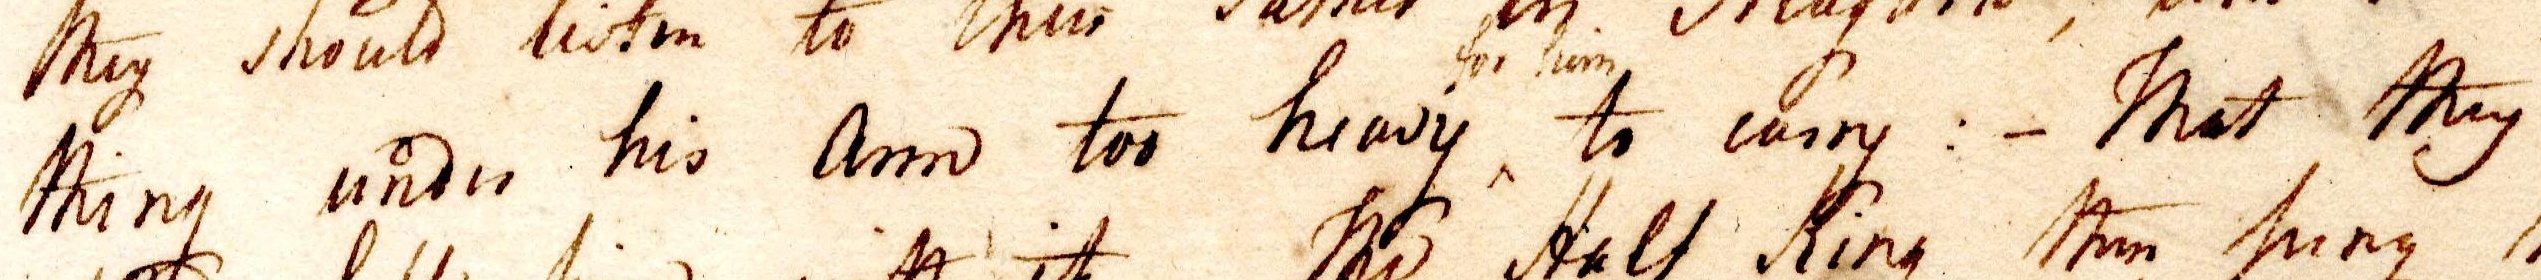thing under his Arm too heavy ^ to carry:- That they
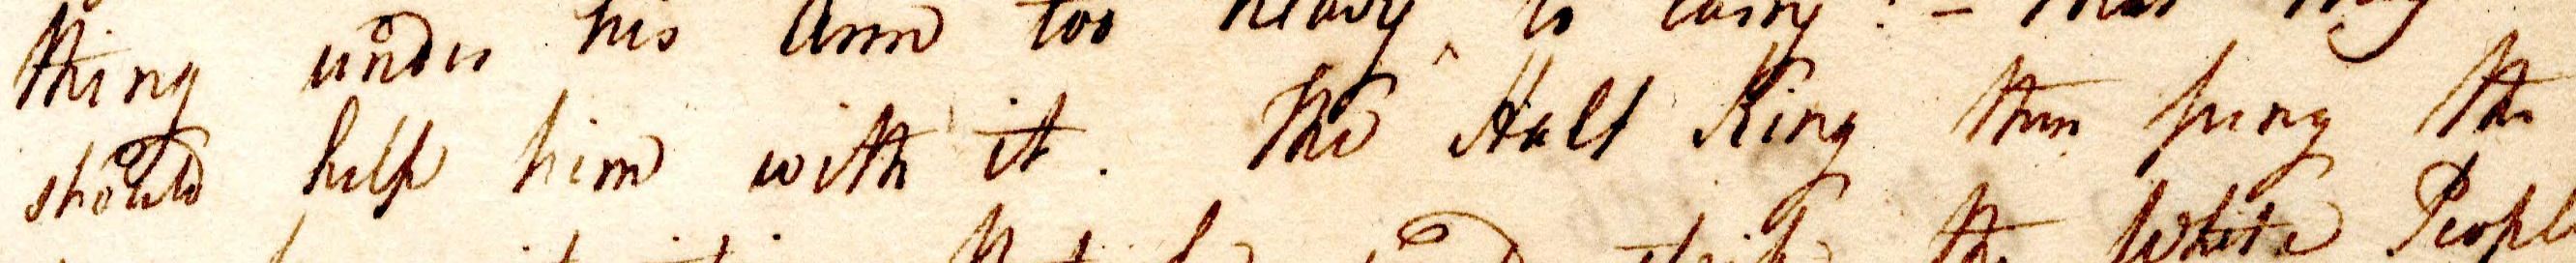should help him with it. The Half King then sung the
